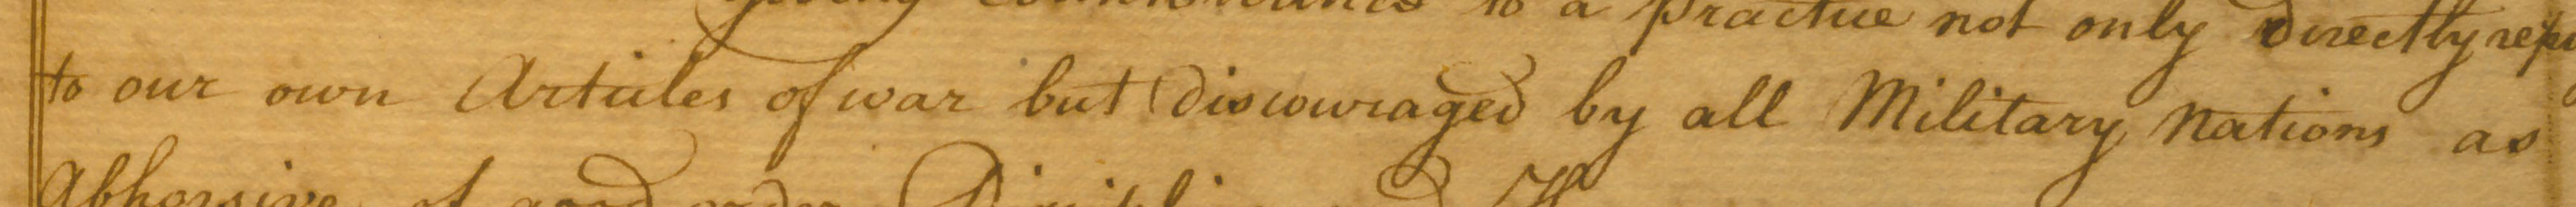to our own Articles of war but discouraged by all Military nations as
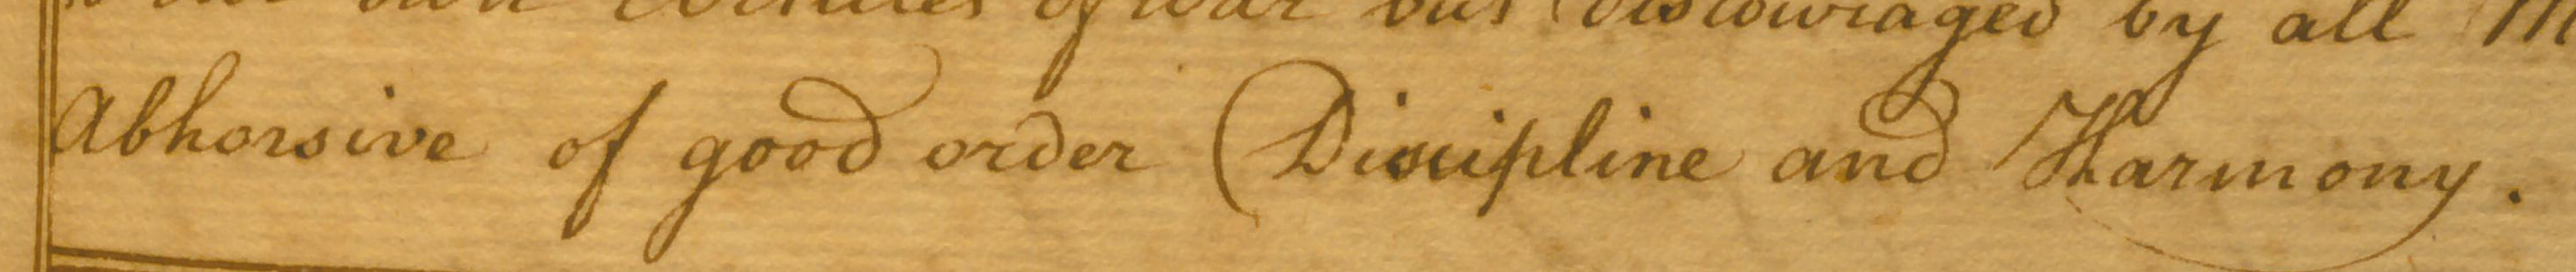Abhorsive of good order Discipline and Harmony.
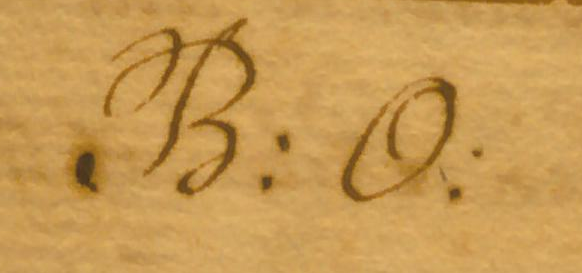B: O:
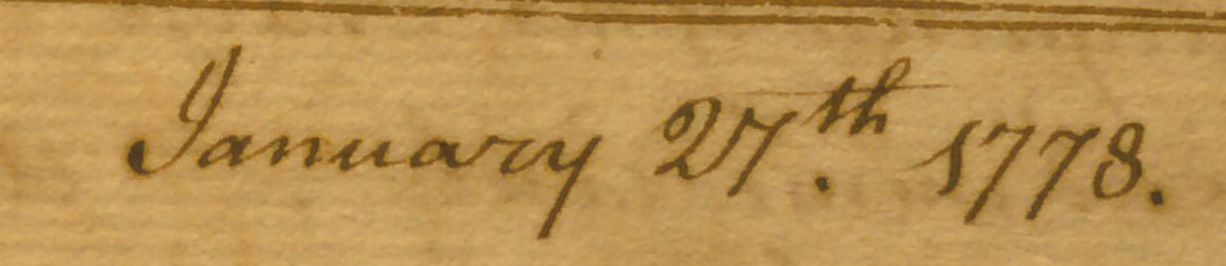January 27^th. 1778.
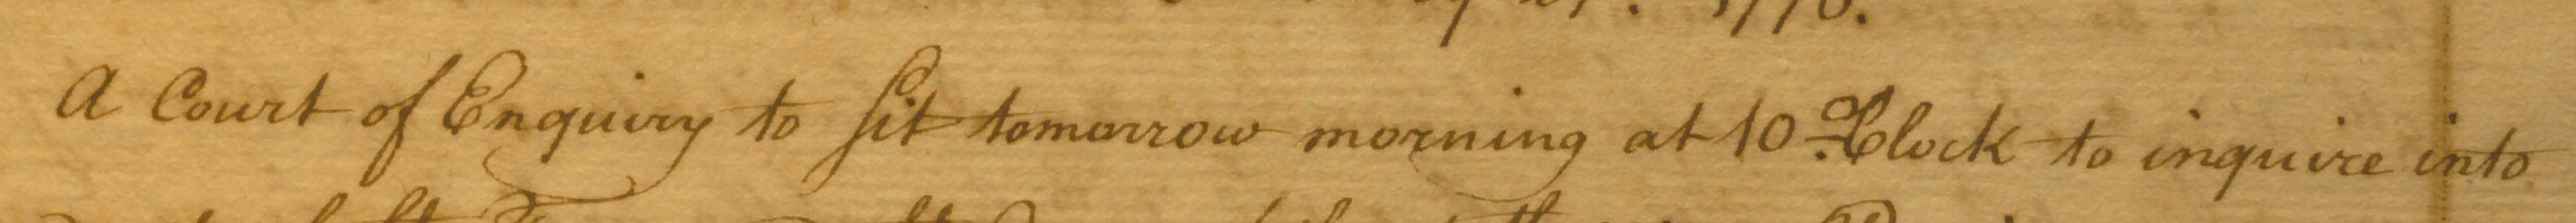A Court of Enquiry to sit tomorrow morning at 10 ^o.Clock to inquire into
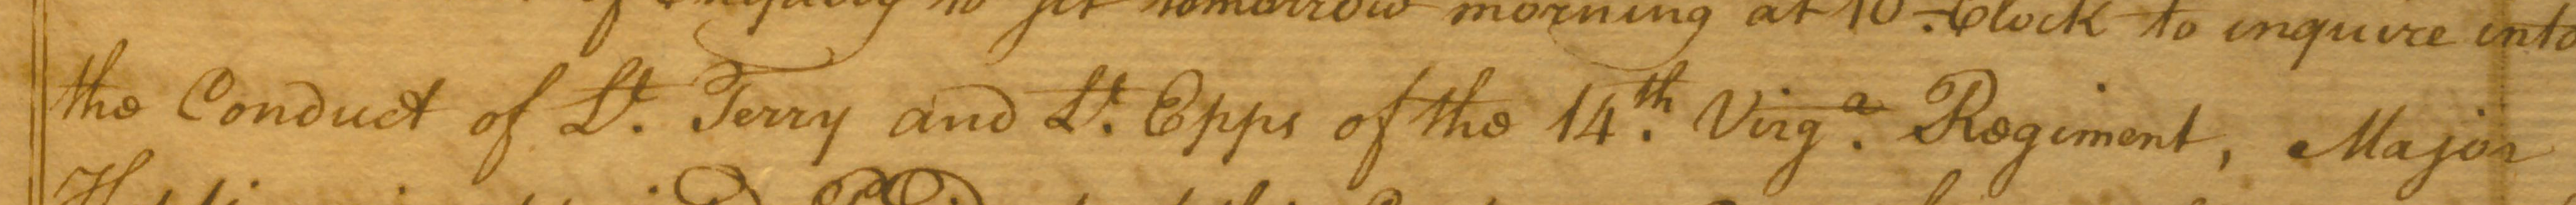the Conduct of L^t. Terry and L^t. Epps of the 14^th. Virg^a. Regiment, Major
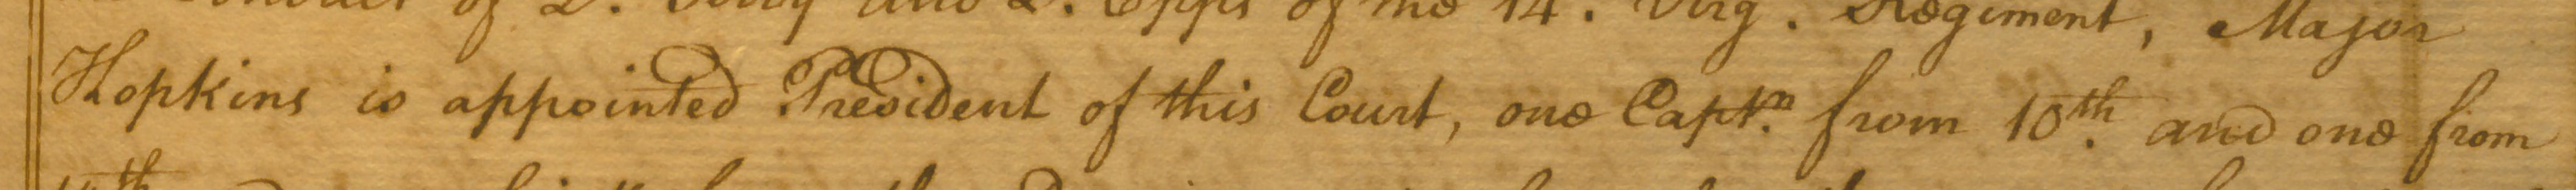Hopkins is appointed President of this Court, one Capt^n. from 10^th. and one from
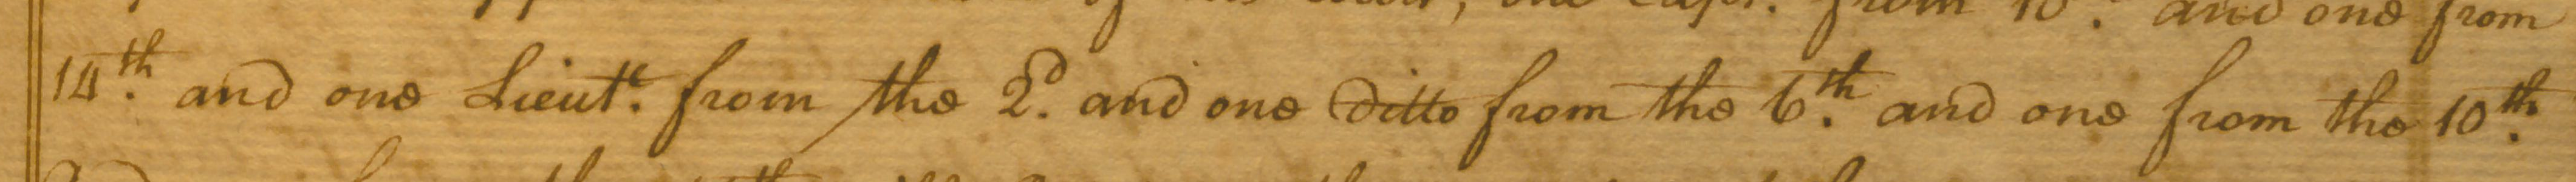14^th. and one Lieut^t. from the 2^d. and one ditto from the 6^th. and one from the 10^th.
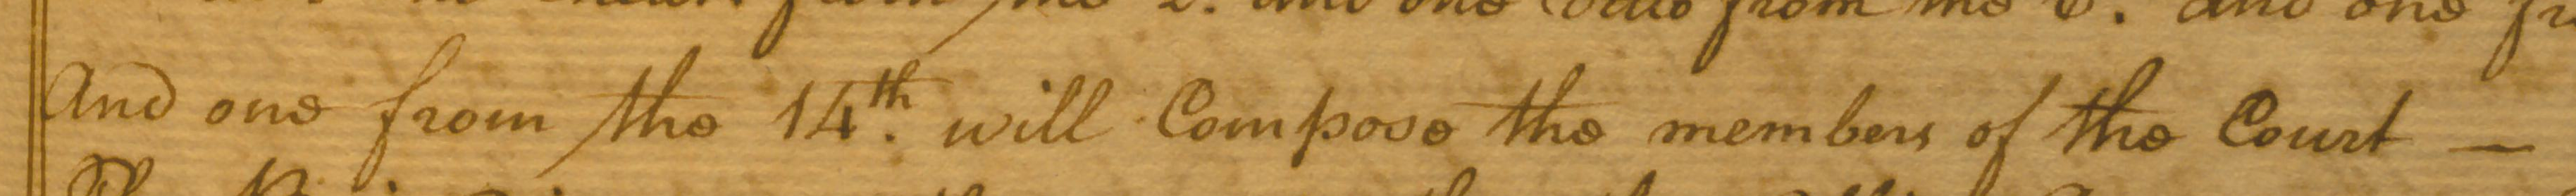and one from the 14^th. will Compose the members of the Court-
